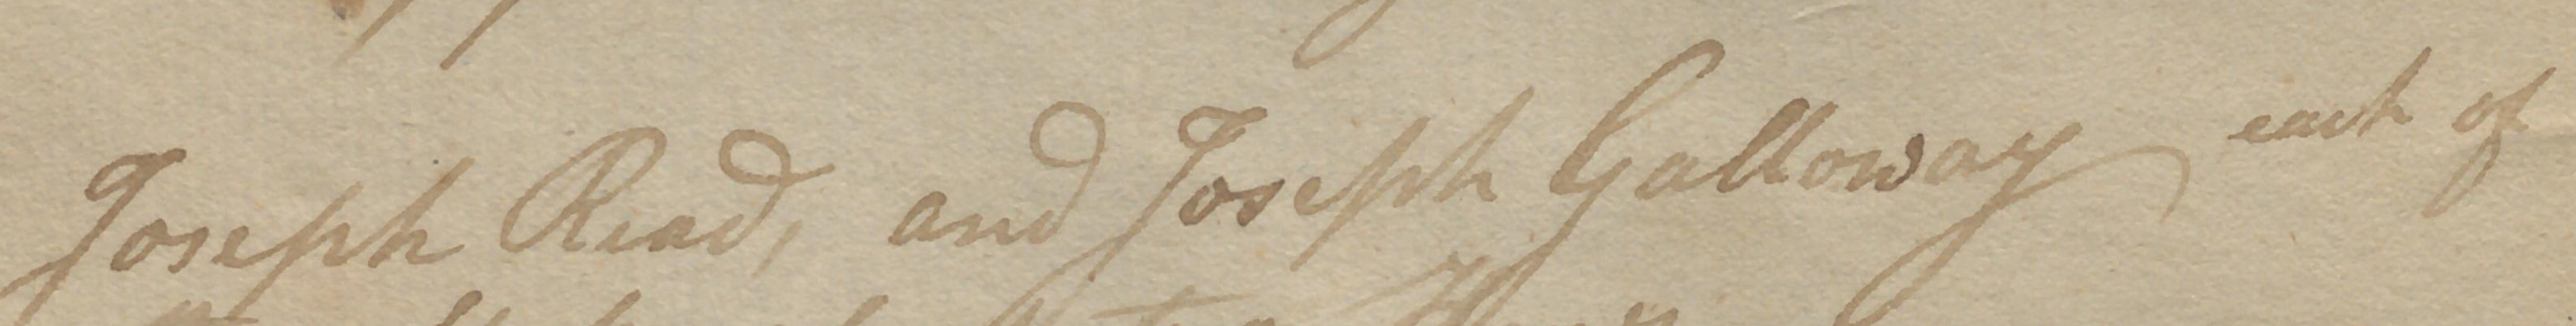Joseph Read, and Joseph Galloway, each of
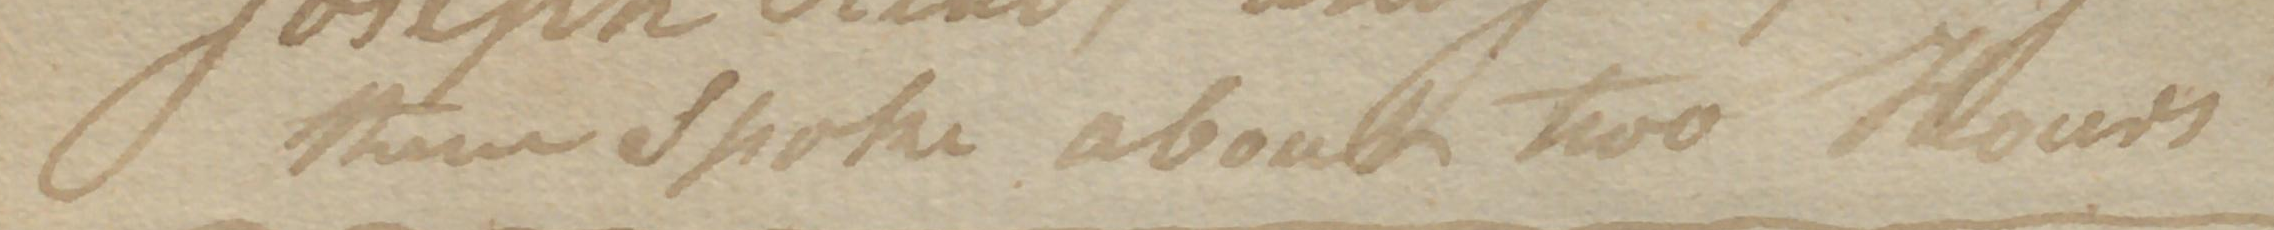them Spote about two Hours
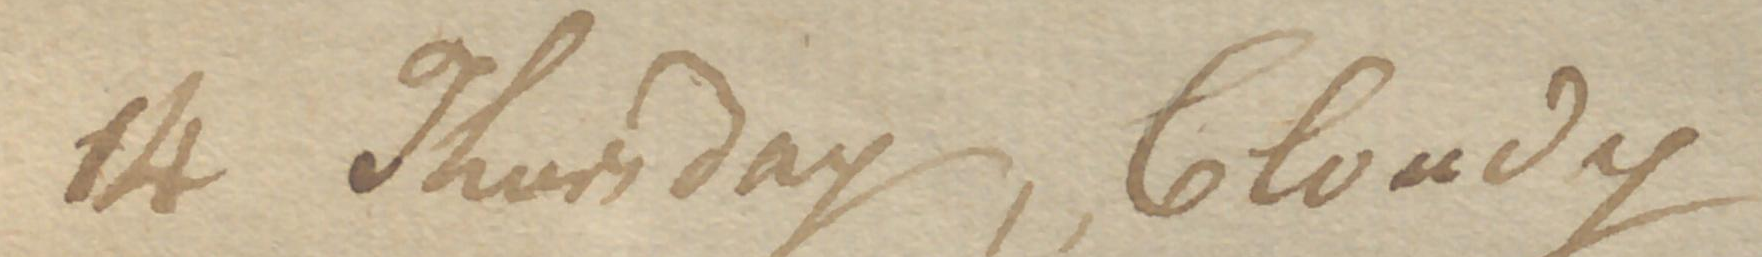14 Thursday, Cloudy
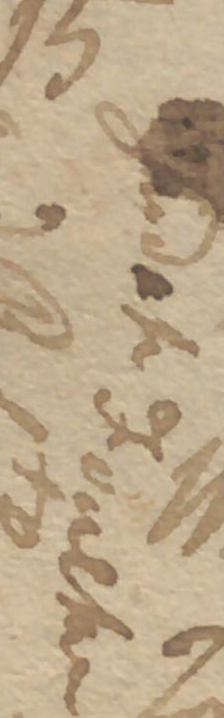Judah Foulke
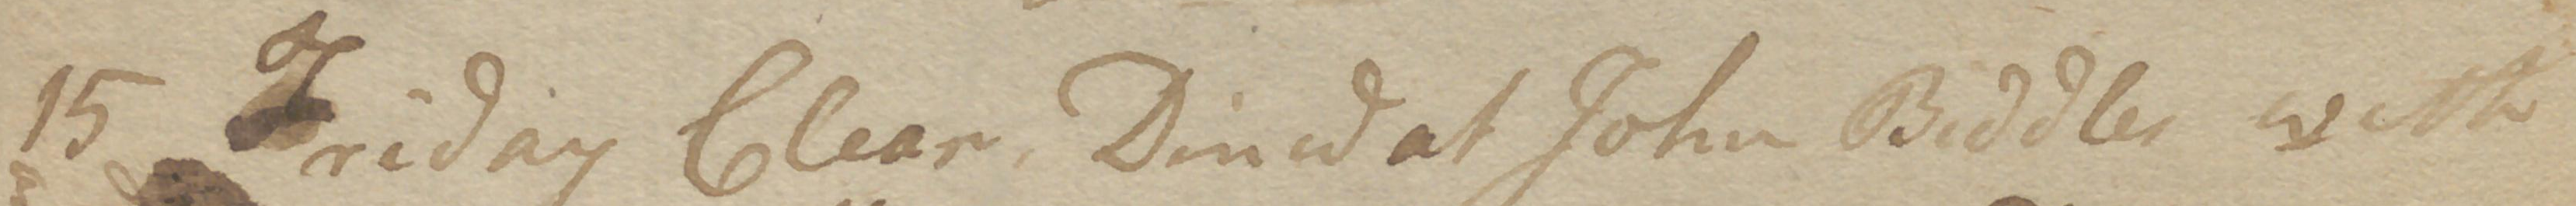15 Friday Clear Dined at John Biddles with
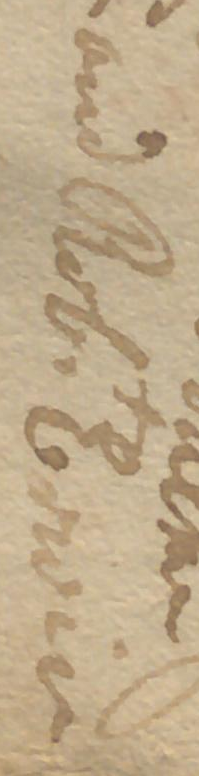and Rob^t. Erwin
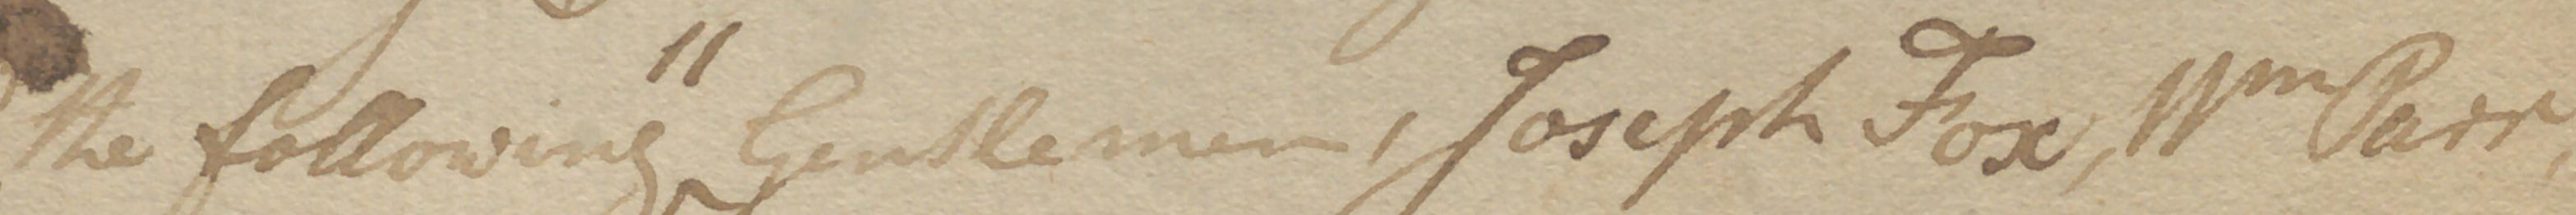the following Gentlemen, Joseph Fox, W^m Parr,
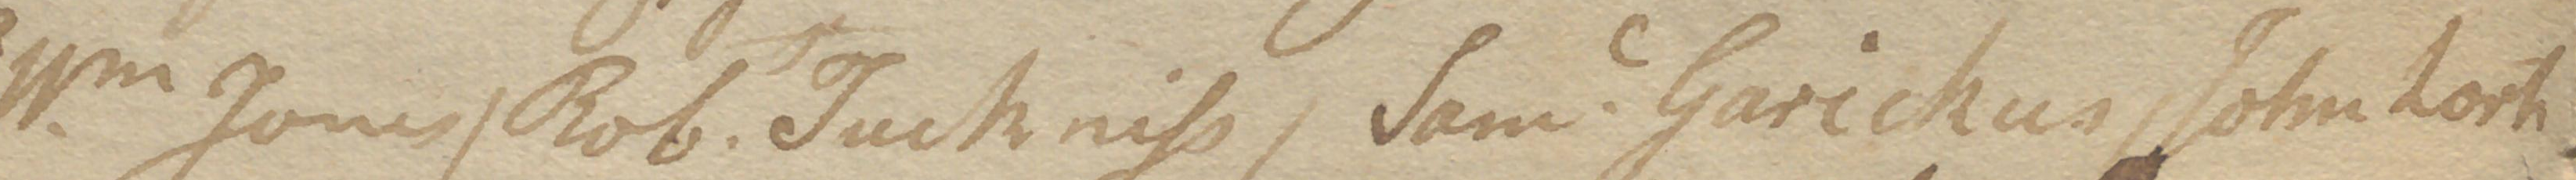W^m. Jones, Rob^t. Tuckniss, Sam^l Garickus John Lort
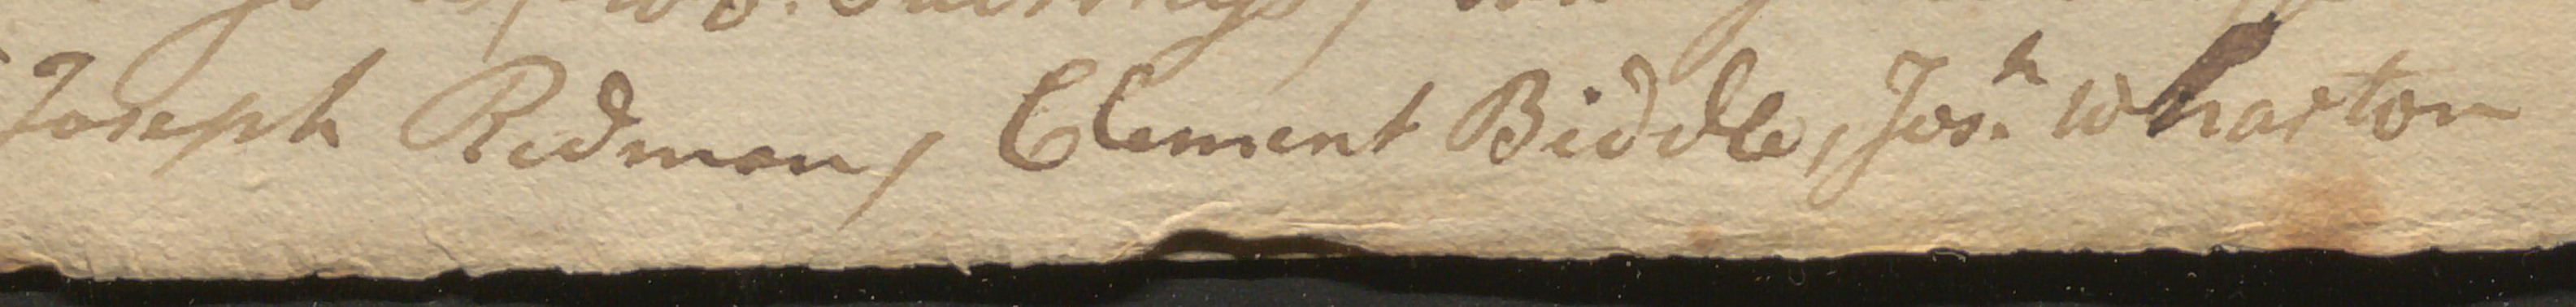Joseph Redman, Clement Biddle Jos^h. wharton
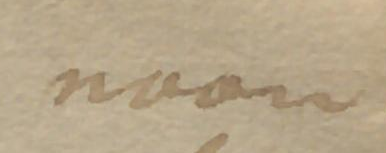noon
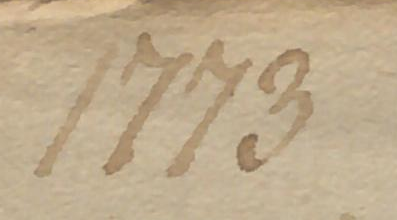1773
